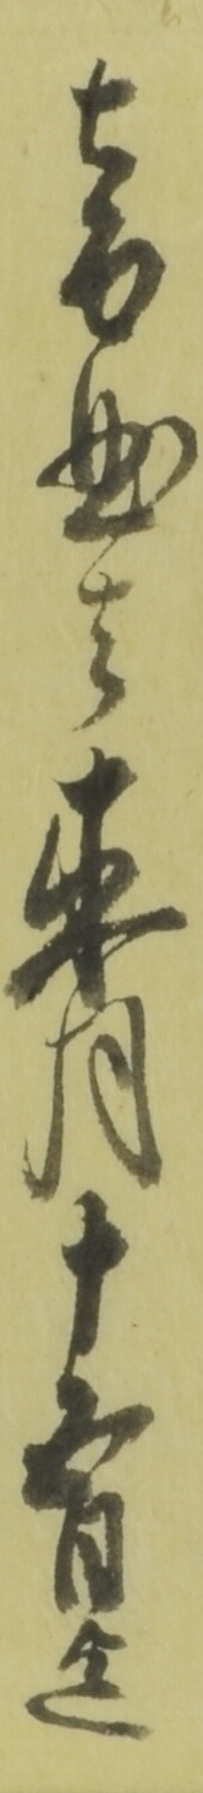音曲は来月十五日迄
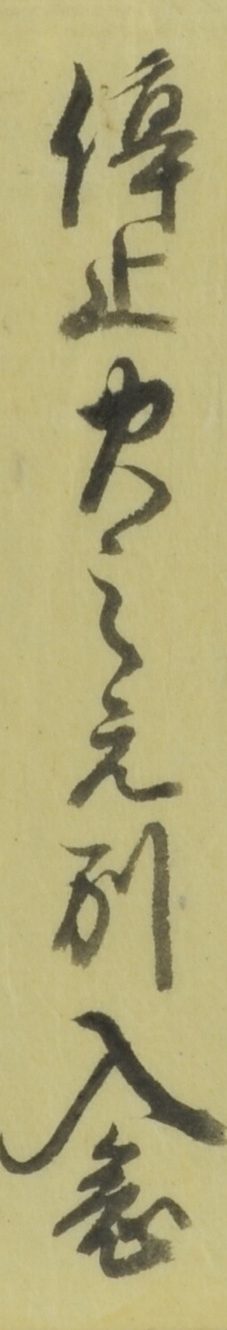停止火之元別入念
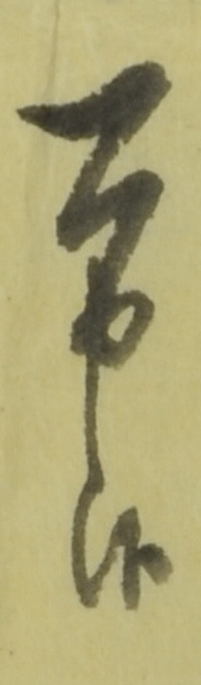可申候
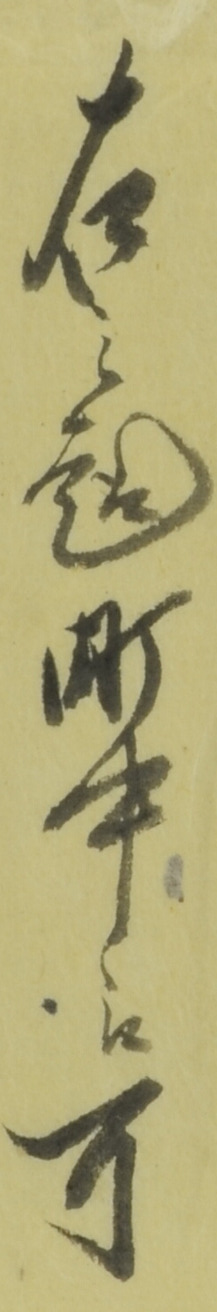右之趣町中江可
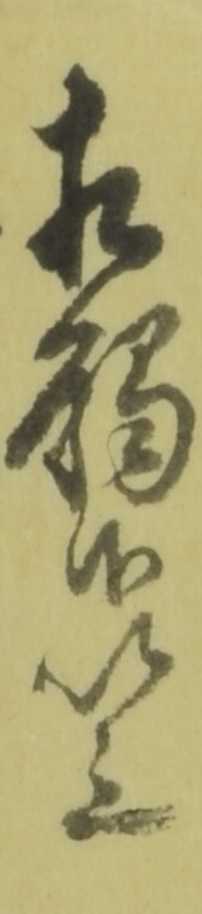相触候以上
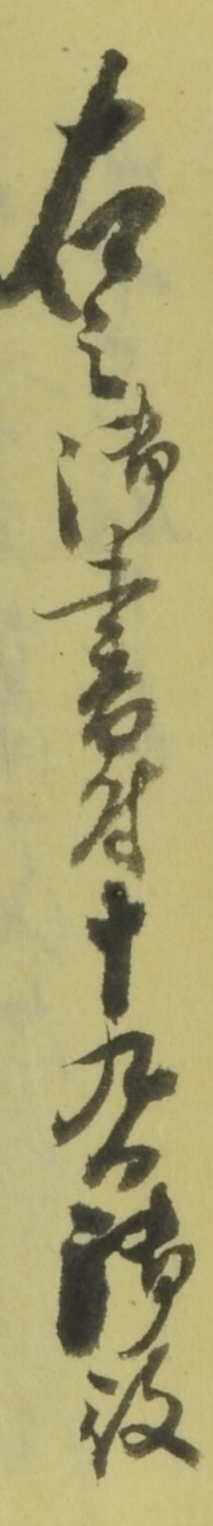右之御書付十九日御役
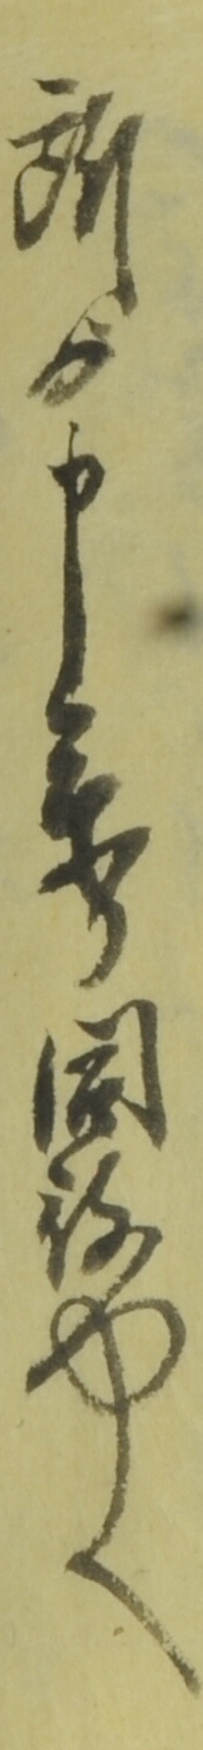所ゟ申参り同役所中へ

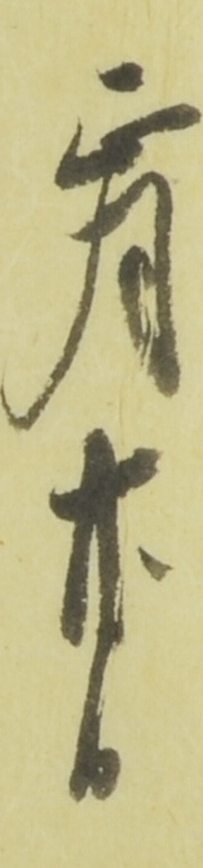正月廿日
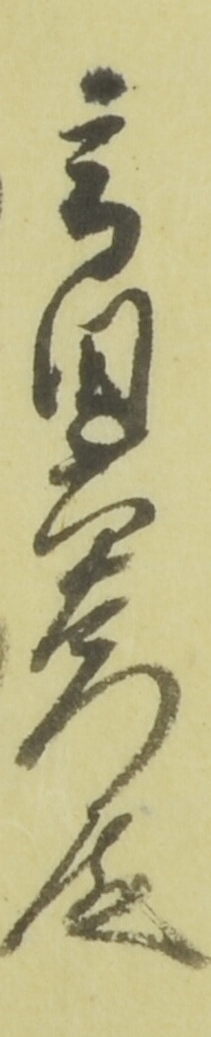高田六右衛門殿
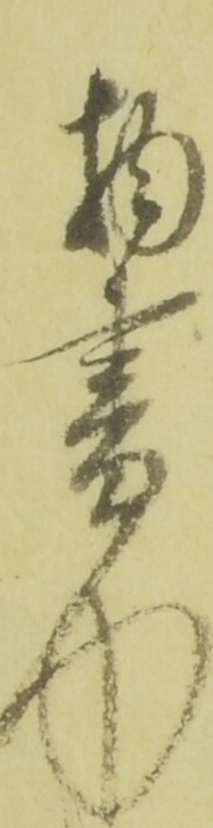物書中
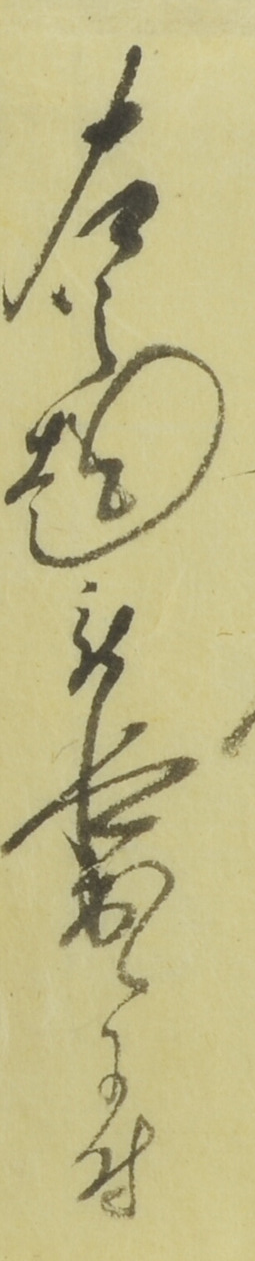右之趣被仰出候に付
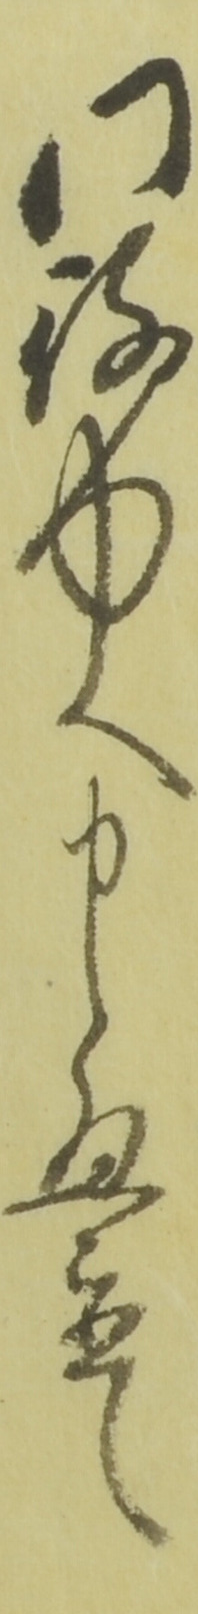同役中へ申通置候
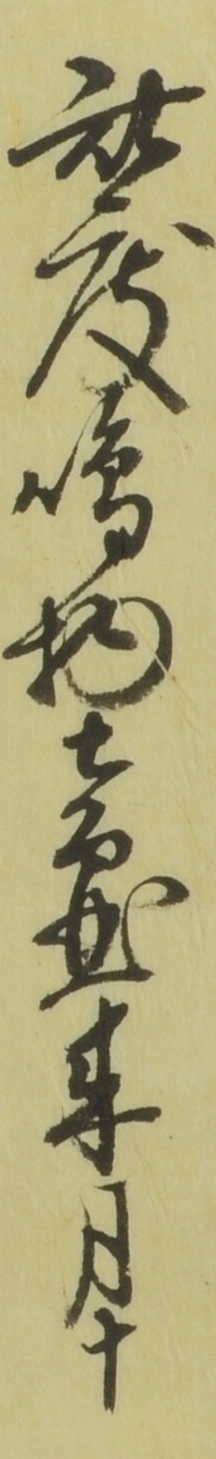此度鳴物音曲来月十
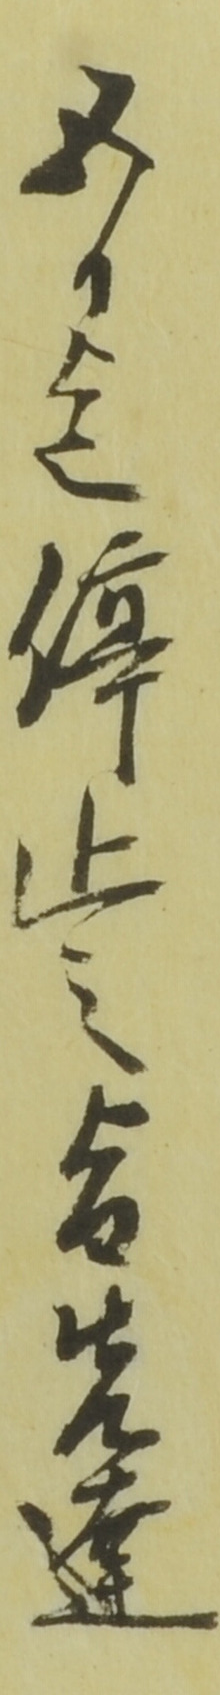五日迄停止之旨先達
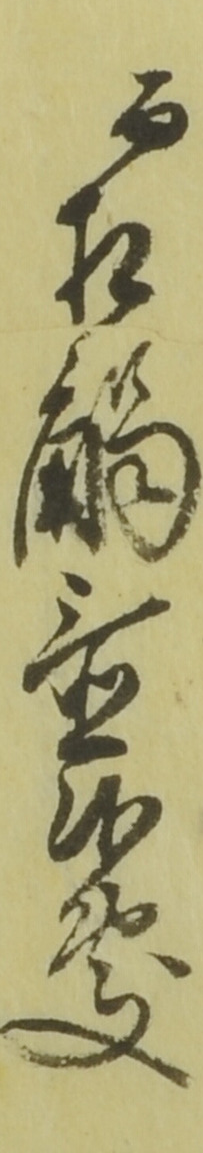而相触置候処
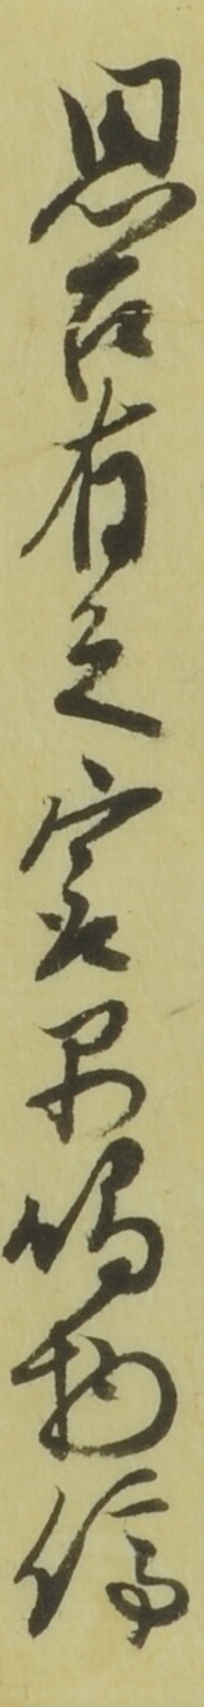思召有之最早鳴物停
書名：御触書御書附控
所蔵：伊那市立高遠町図書館・合同会社AMANE
